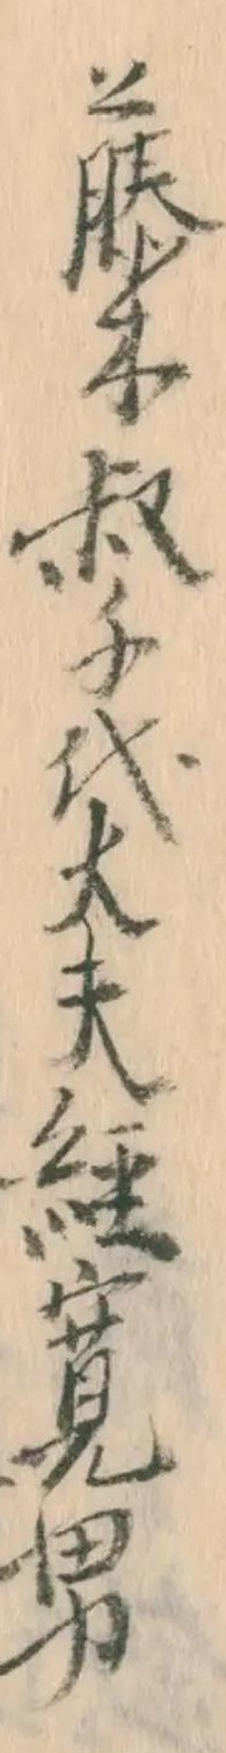藤木叔千代大夫経寛男
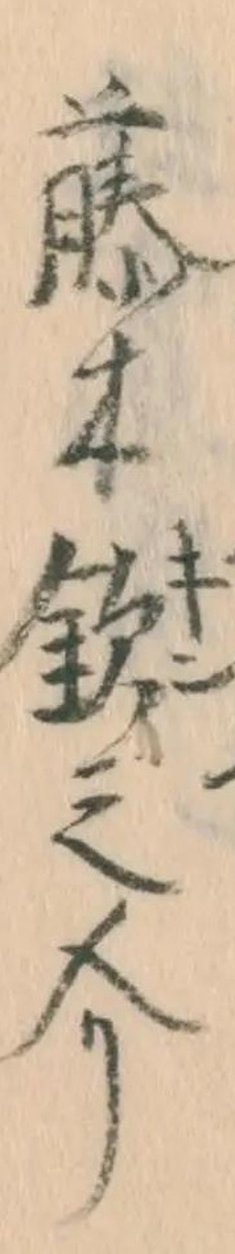藤木欽之介
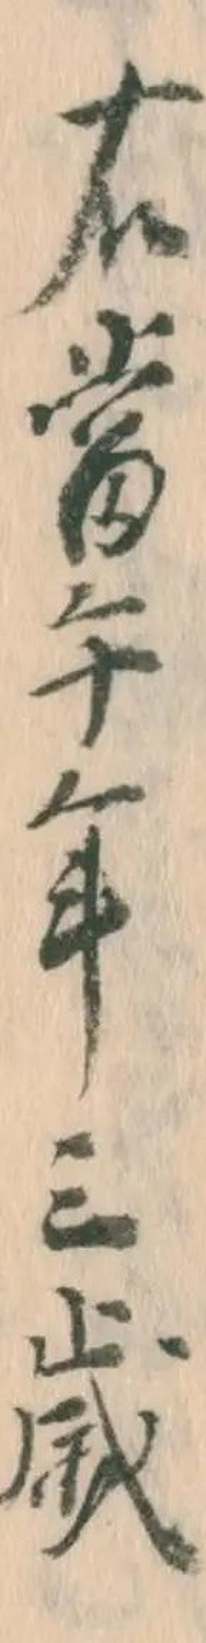右當午年三歳
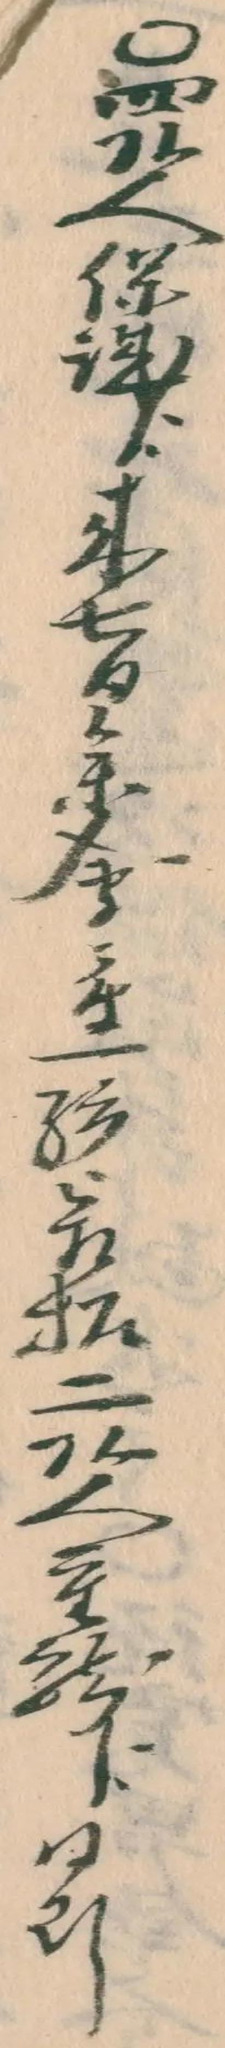○四頭人保誠ゟ来七日参會ニ付一統被相招二頭人重龍ゟ同断
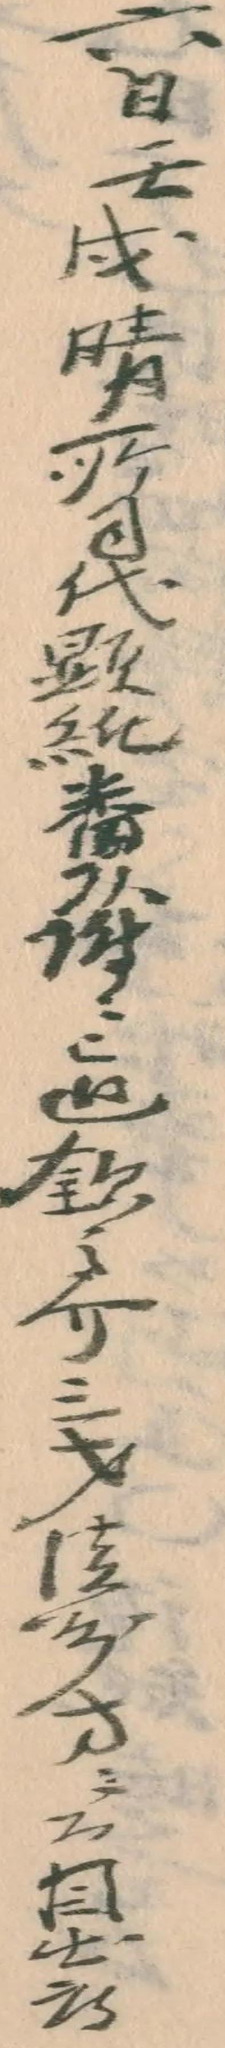六日壬戌晴所司代顕純番頭附ニ被廻欽之介三才清州方ニ而目出度
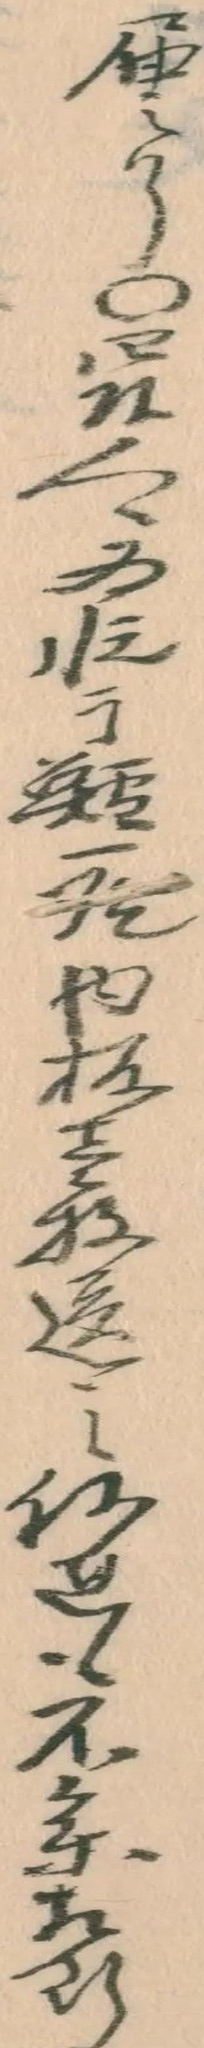届之了〇四頭人へ為祝干鱈一尾内板壱枚送之何れも不参相断
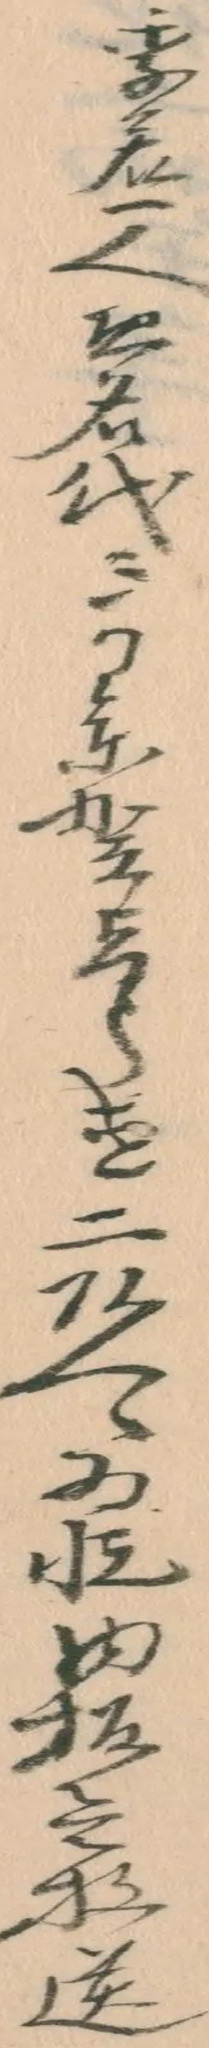季若一人惣名代二可参賀旨被遣二頭人へ為祝内板壱枚送
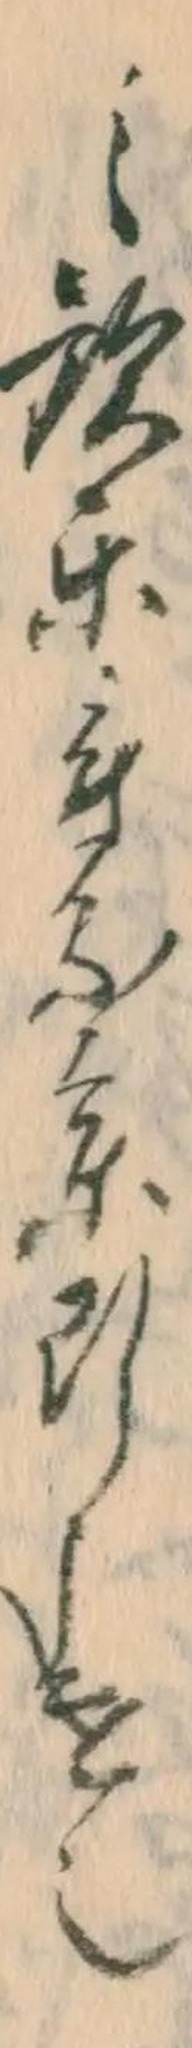之歓楽ニ付不参断申遣也
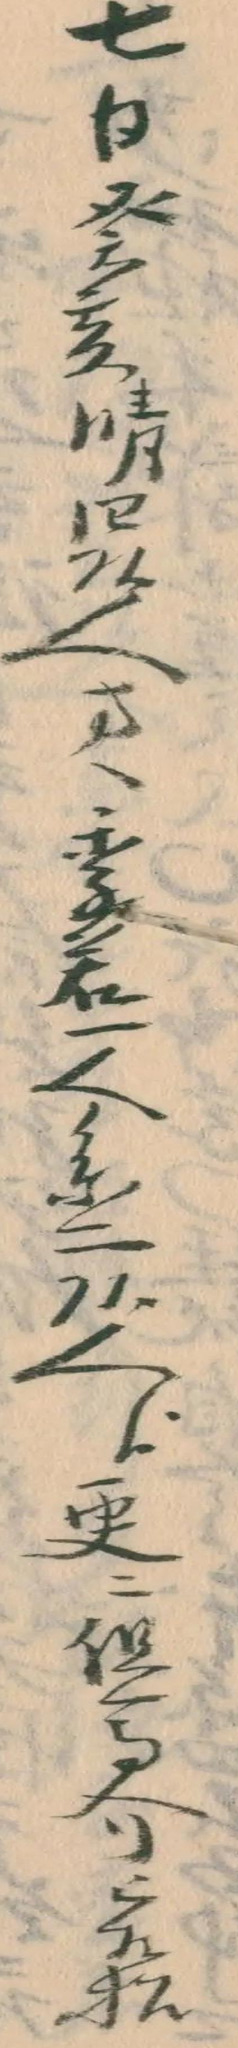七日癸亥晴四頭人方へ季若一人参二頭人ゟ更二但馬介被相招
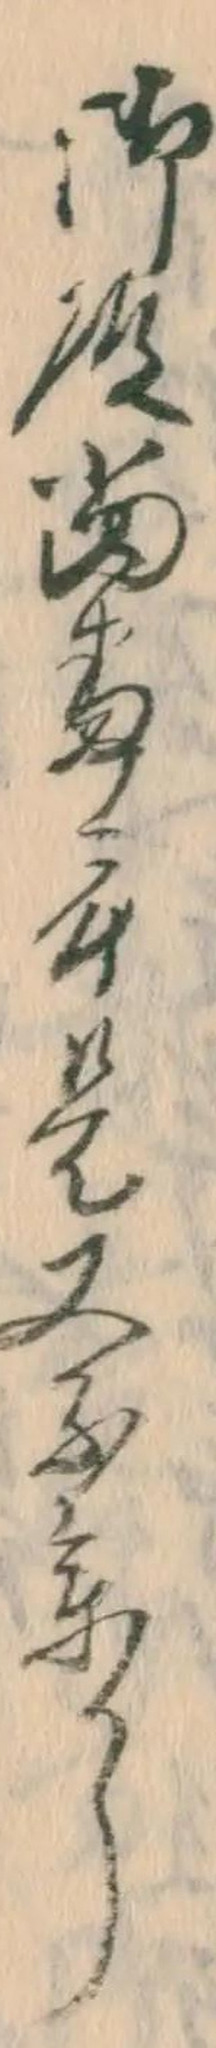御殿當番ニ付是又不参了
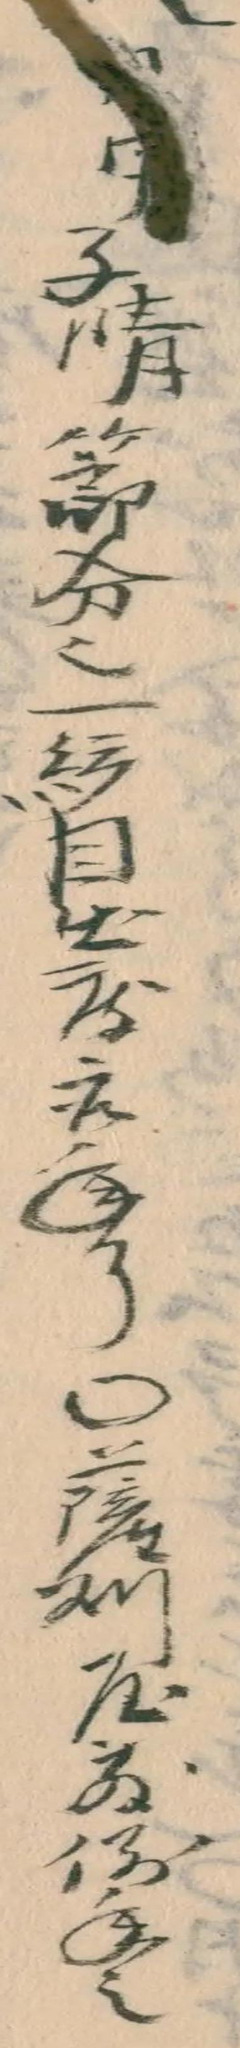八日甲子晴節分也一統目出度取年了○薩州屋敷例年之
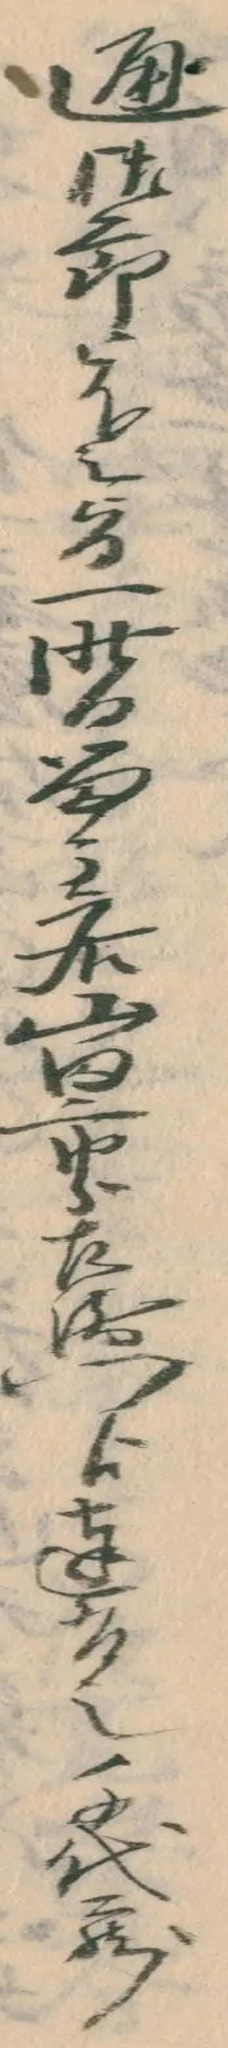通御節被下之旨一昨日留守居山田市郎左衛門ゟ達有之千代蔵
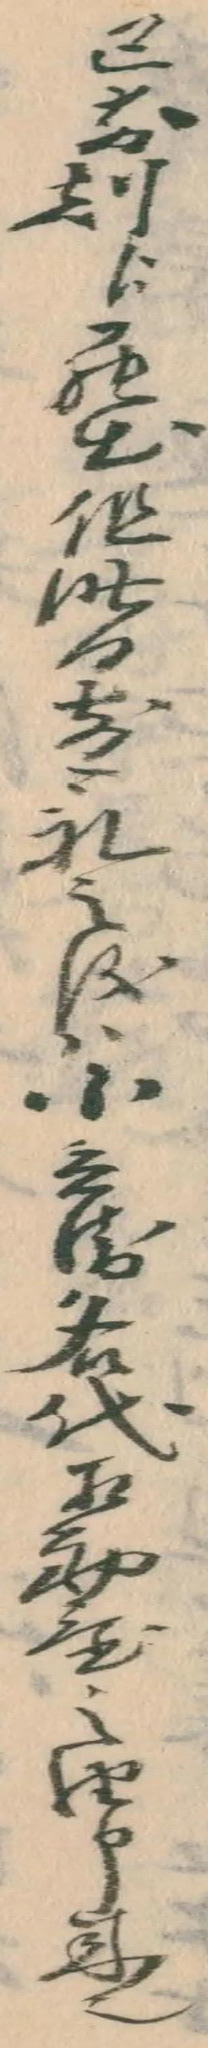巳前刻ゟ罷出但昨日前御礼之儀ハ小兵衛名代相勤置之由申来也
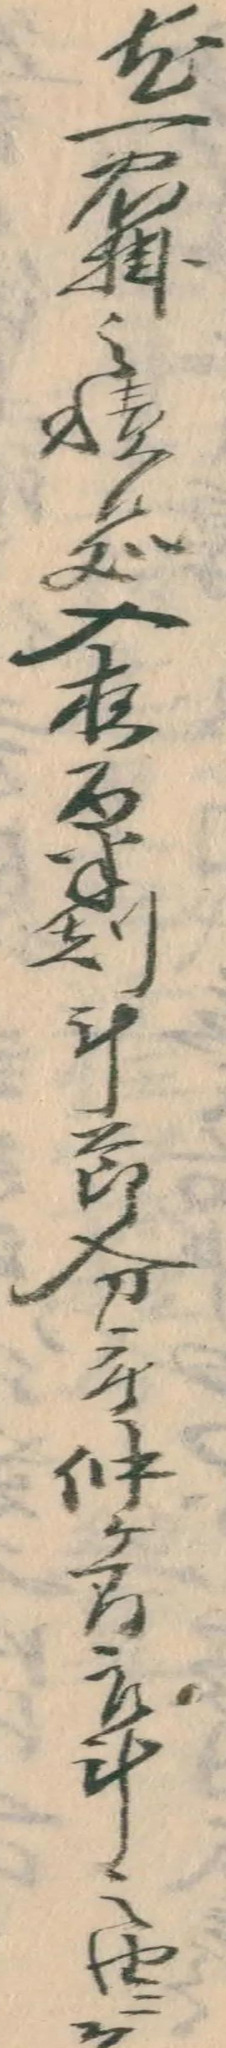尤一宿掛之積候処入夜酉半刻斗節分ニ付仲ヶ間取斗之由ニ而
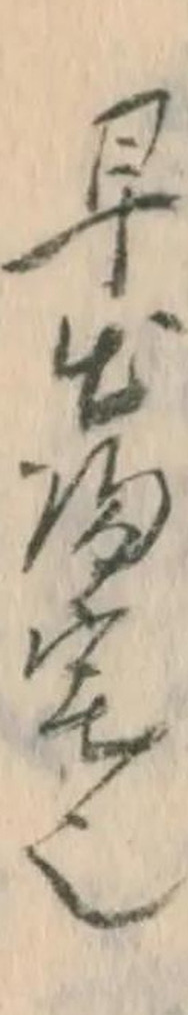早出帰宅也
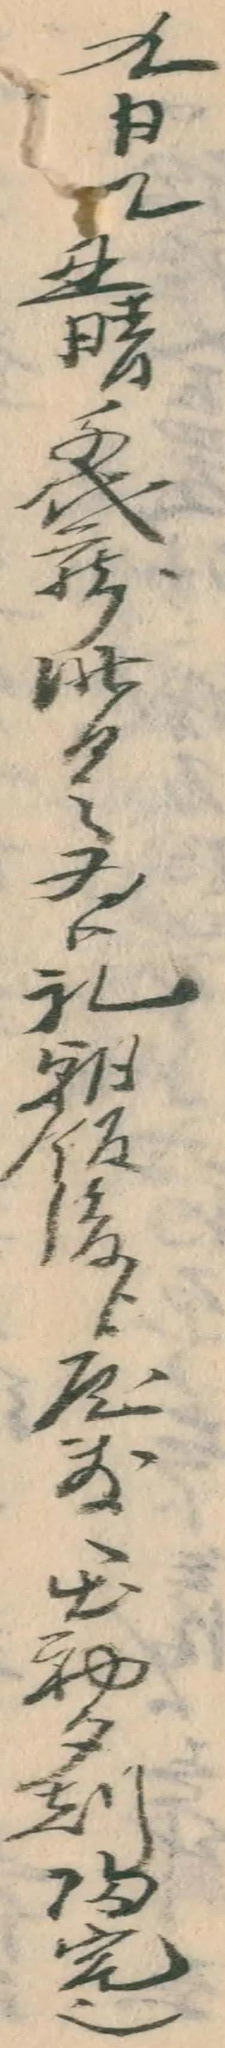九日乙丑晴千代蔵昨日之為御礼朝飯後ゟ屋敷へ出勤夕刻帰宅也
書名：賀茂社記録. 第70冊
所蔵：国立国会図書館 National Diet Library, JAPAN
